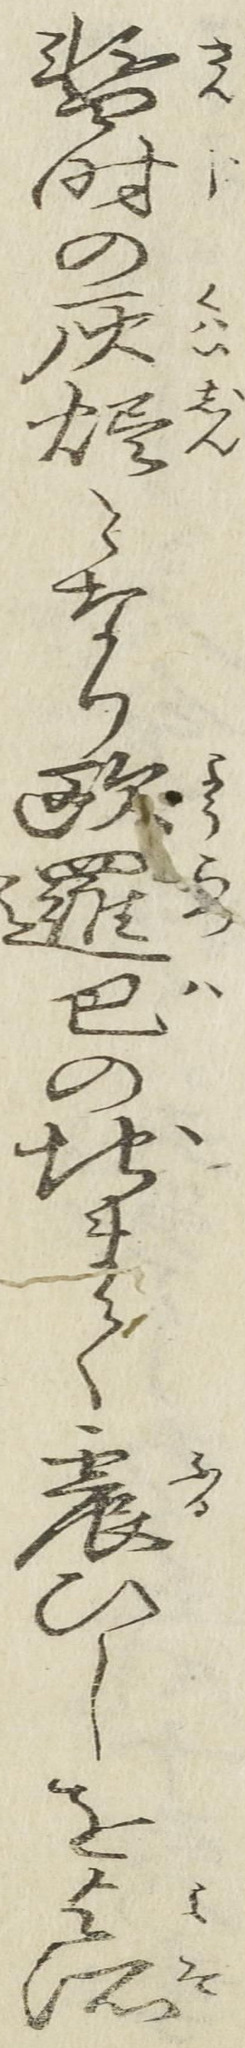暫時の灰燼となり欧邏巴の地まで震ひしを与所
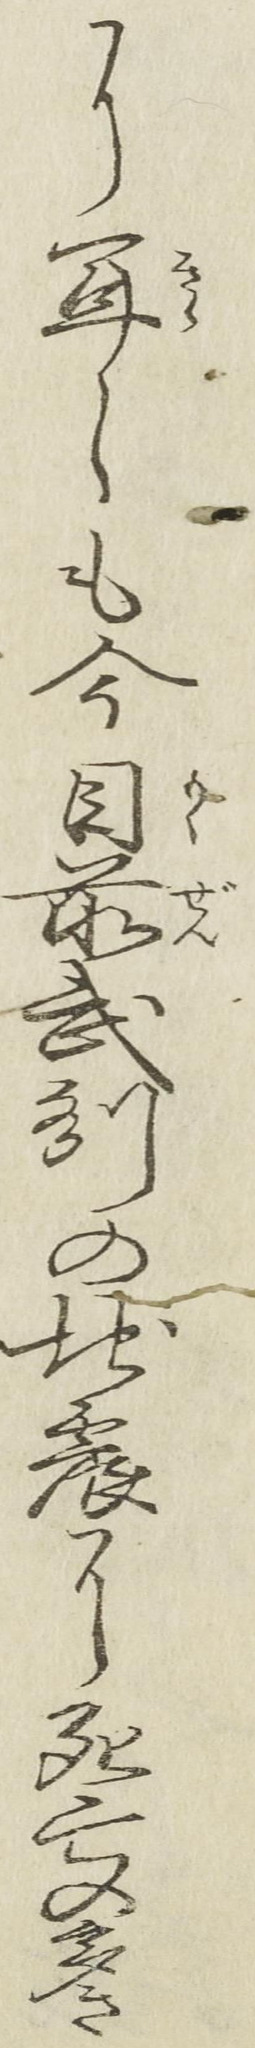に聞しも今目前武州の地震に死亡の多き
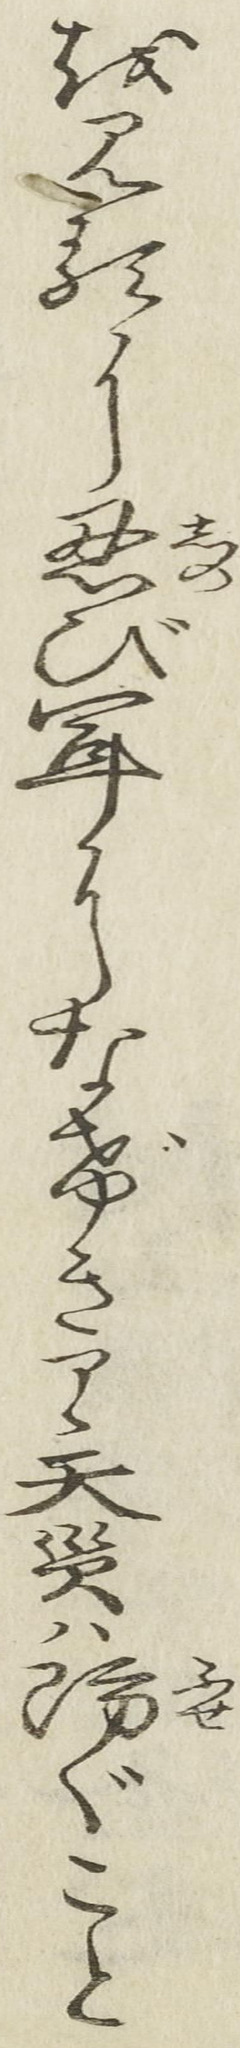を見るに忍び聞になげきアゝ天災は防ぐこと
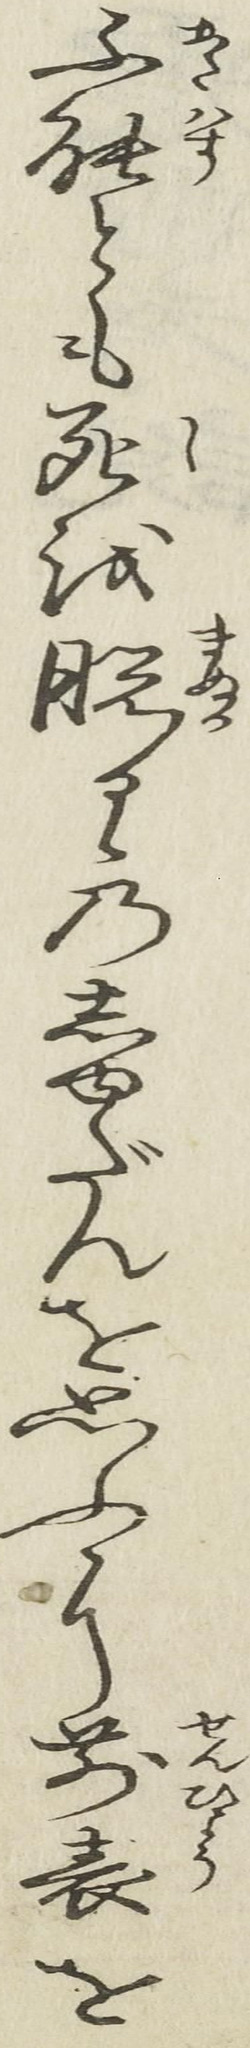不能とも死を脱るゝのしゆだんを思ふに前表を
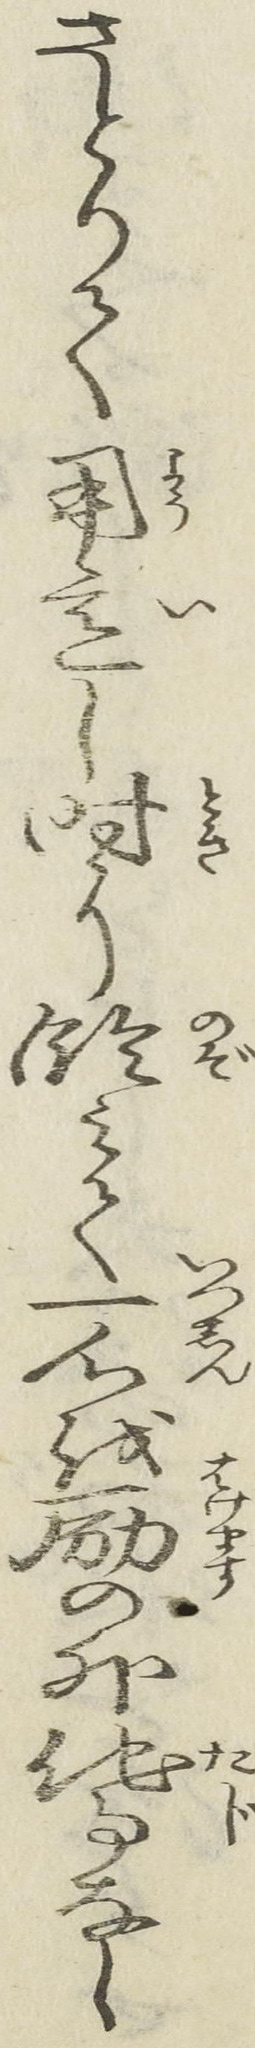さとりて用意し時に臨みて一心を励の外他事なし
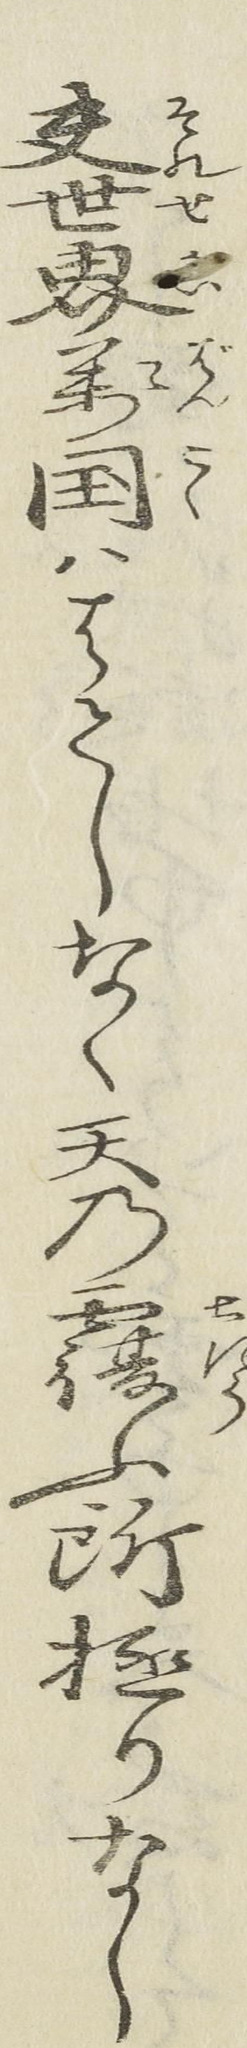一夫世界万国ははてしなく天の覆ふ所極りなし
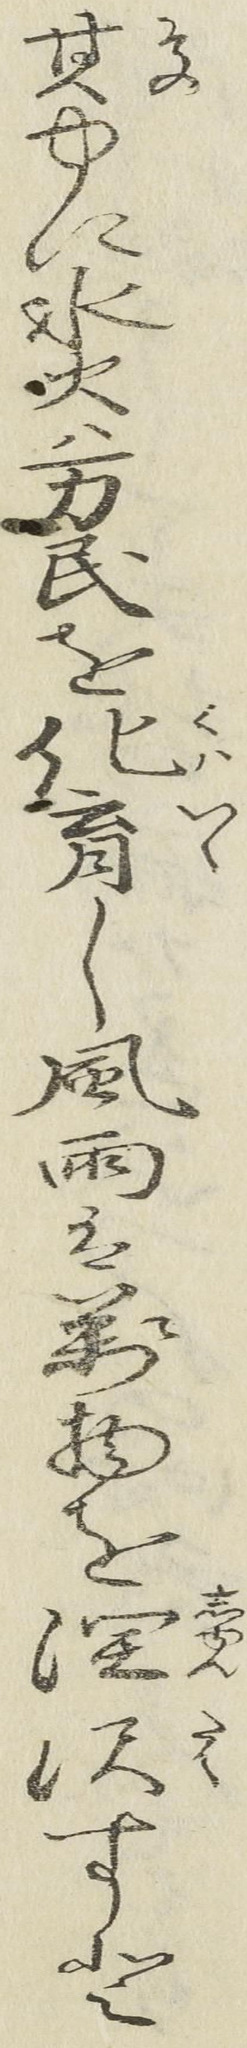其中に水火は万民を化育し風雨は万物を潤沢すと
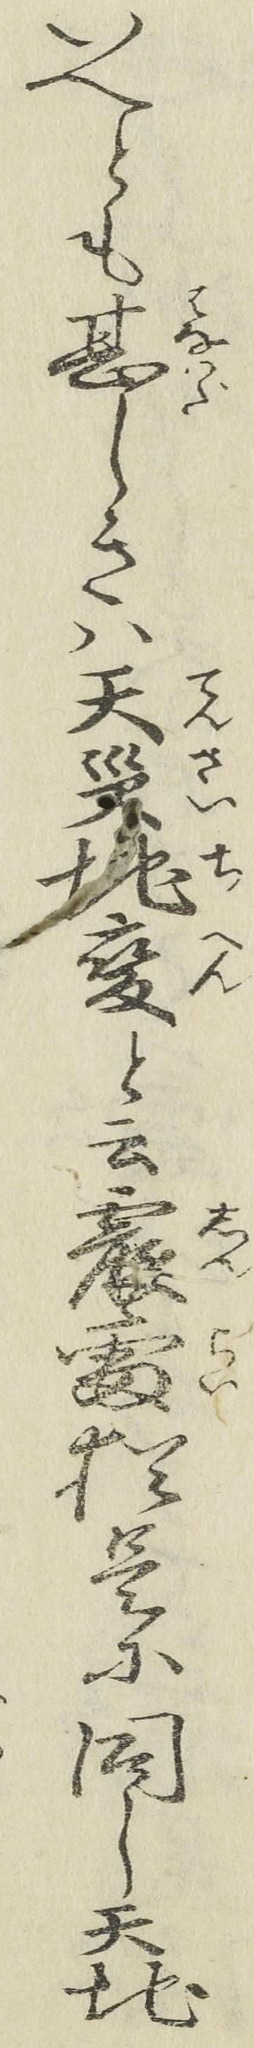いへとも甚しきは天災地変と云震雷猶是に同じ天地
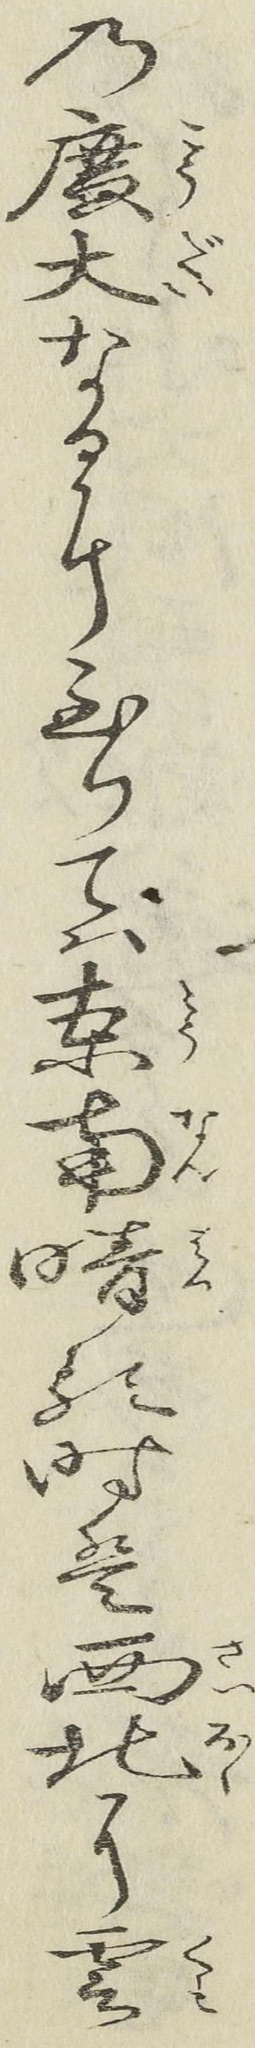の広大なるに至りては東南晴る時は西北に雲
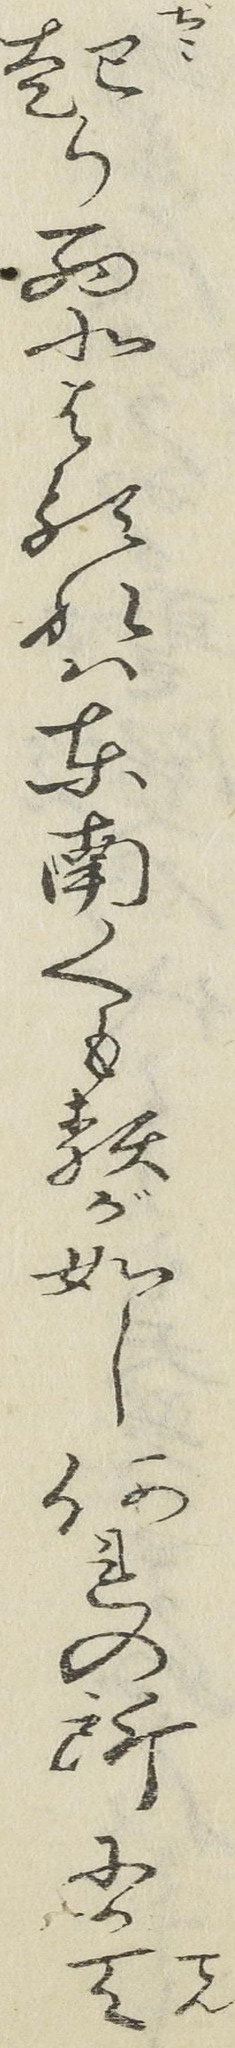起り西北はるれは東南くもるが如し何れの所にか天
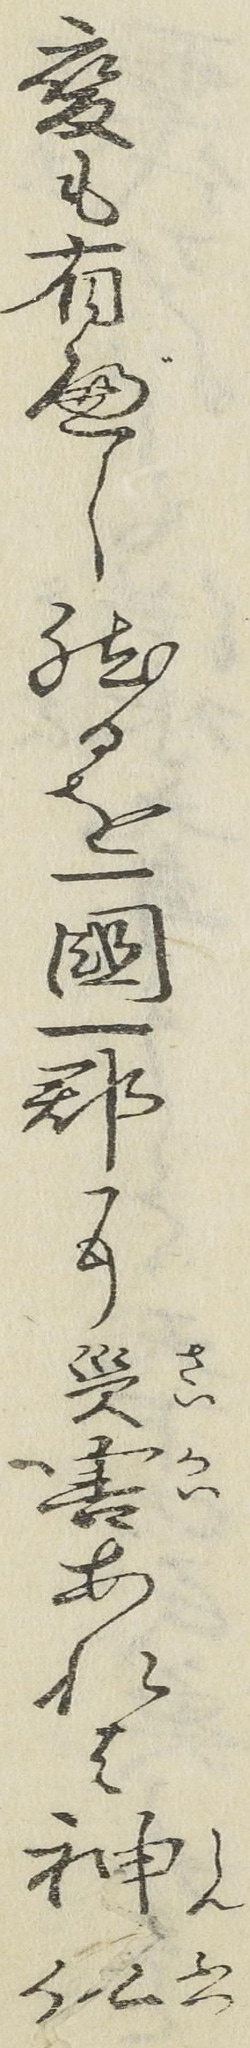変も有へし然るを一国一郡に災害あれは神仏
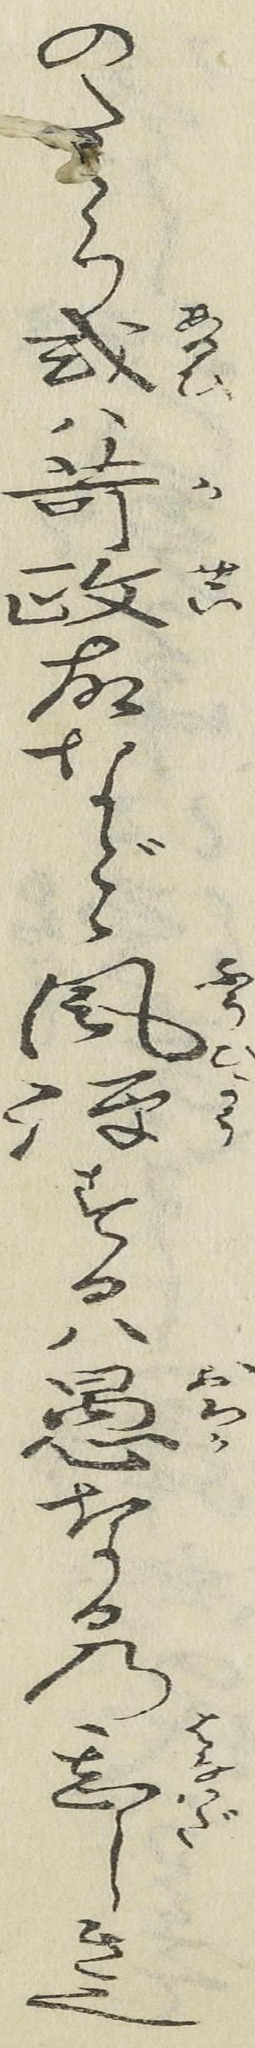のたゝり或は苛政故などゝ風評するは愚なるの甚しき也
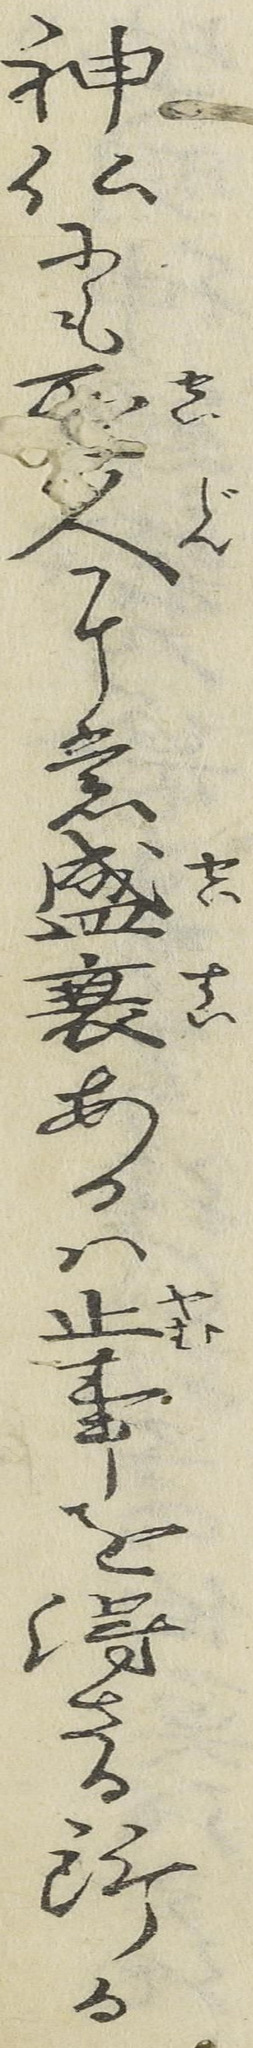神仏にも聖人にも盛衰あるは止事を得さる所る

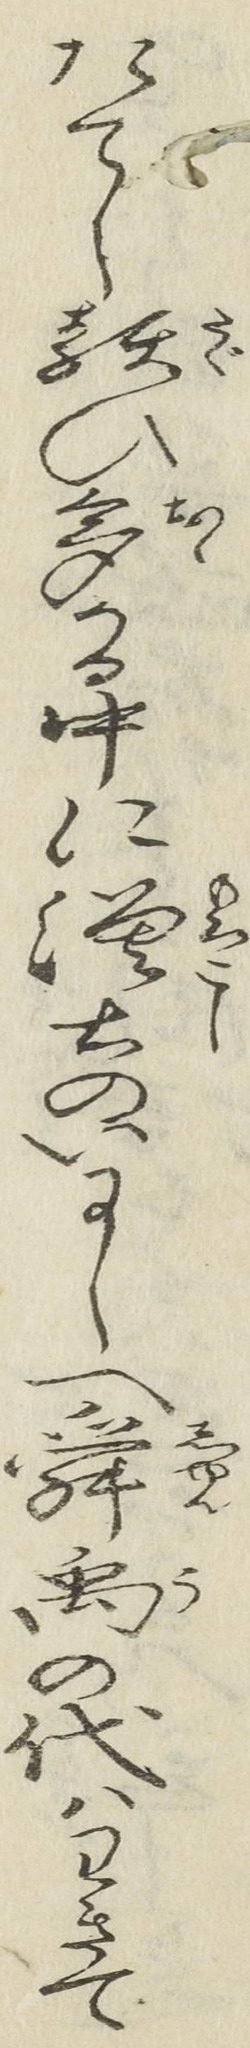たてし類ひ多かる中に漢土のいにしへ舜禹の代はわきて
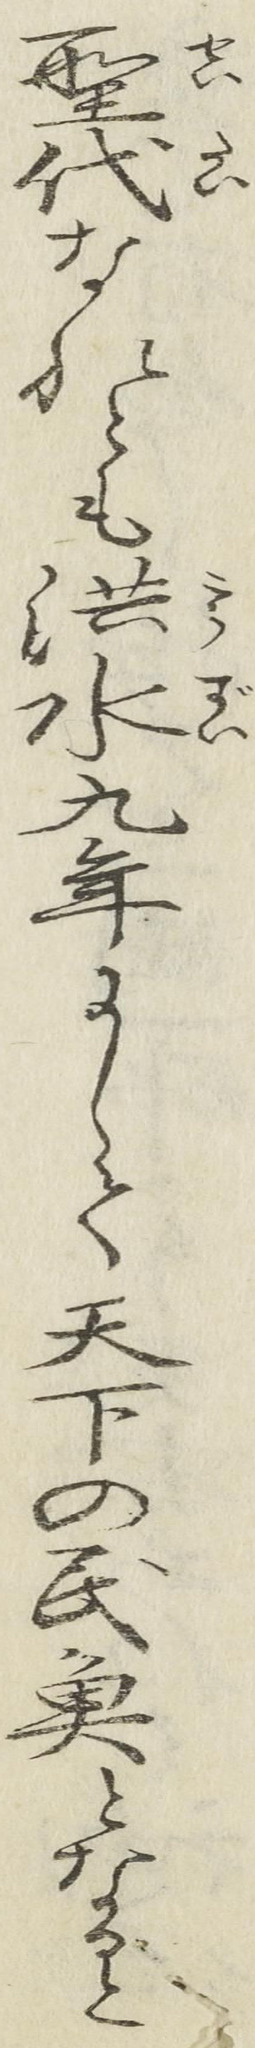聖代なれとも洪水九年にして天下の民魚となること
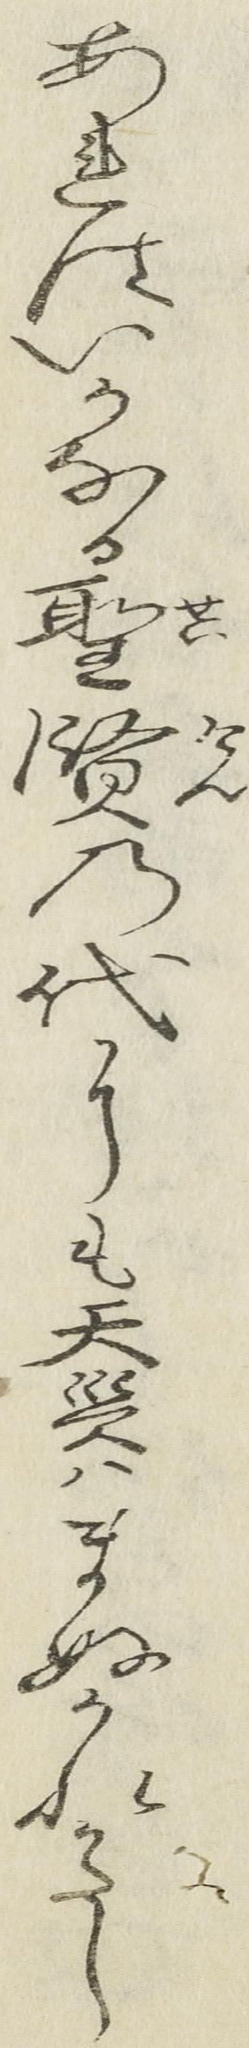あれはいかなる聖賢の代にも天災はまぬかれかたし
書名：震雷考説　全
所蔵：東京大学地震研究所図書室 Earthquake Research Institute Library, The University of Tokyo, JAPAN
